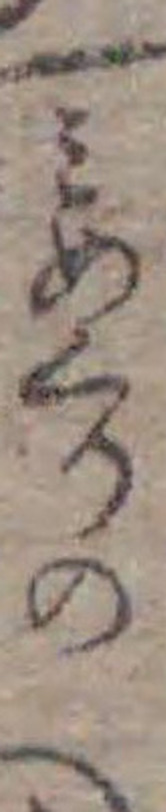みめくりの
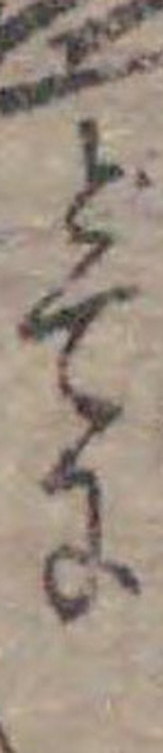どてに
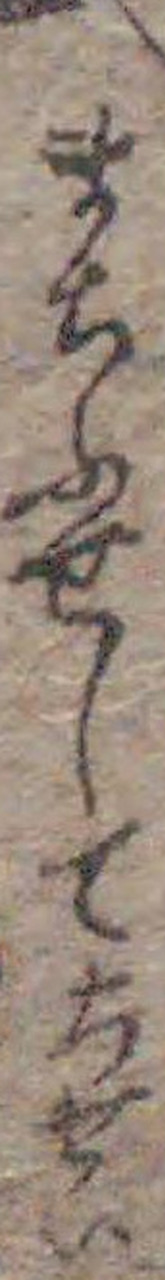まちふせしてちせい
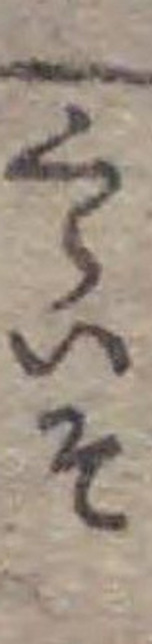くらいぞ
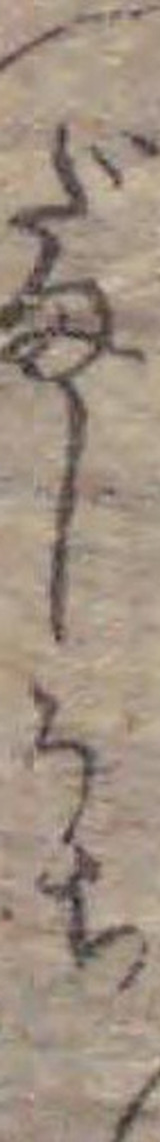だましうち
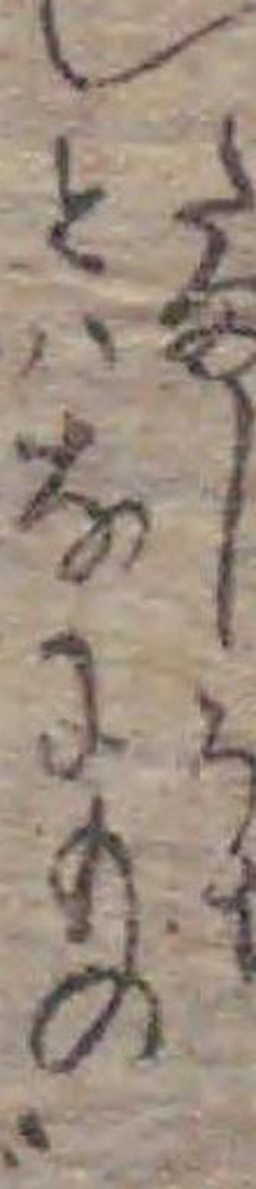とはなにもの
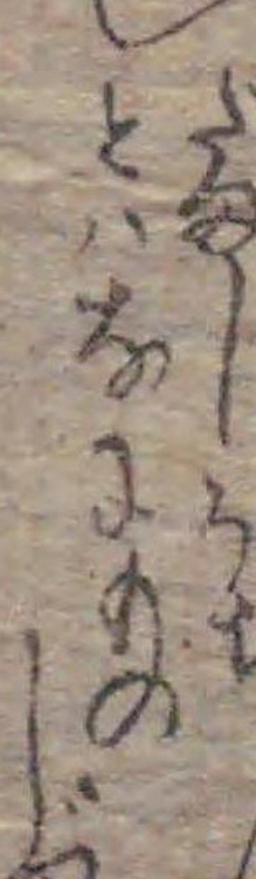とはなにもの
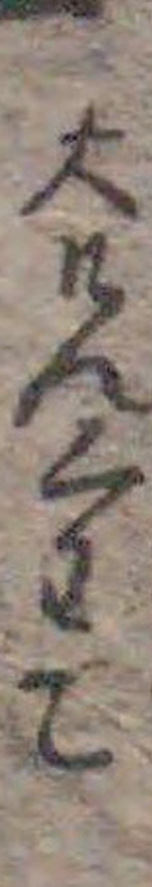大けんくわで
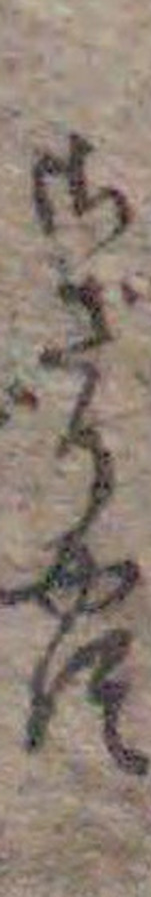御ざりやす
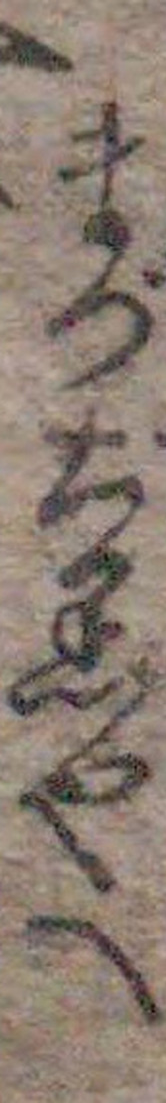まづ大黒やへ
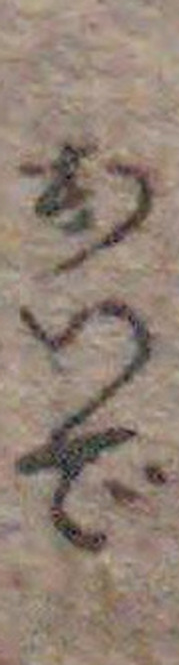おいで

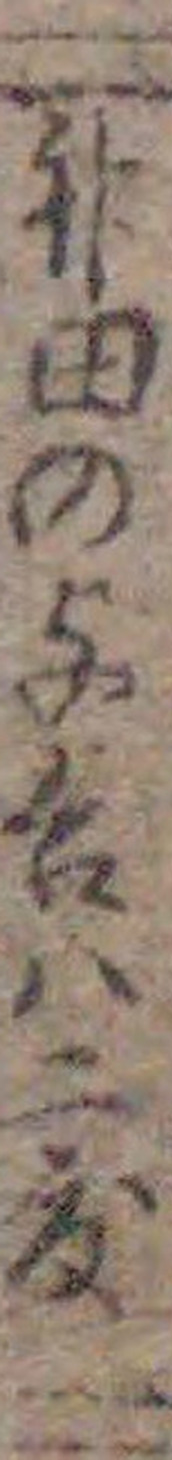神田の与吉は二度
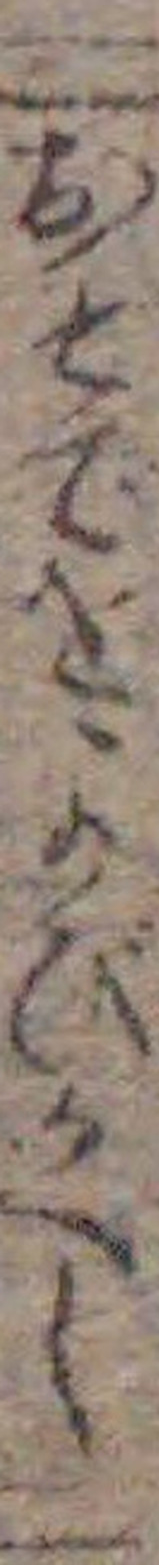おそでをよびかへし
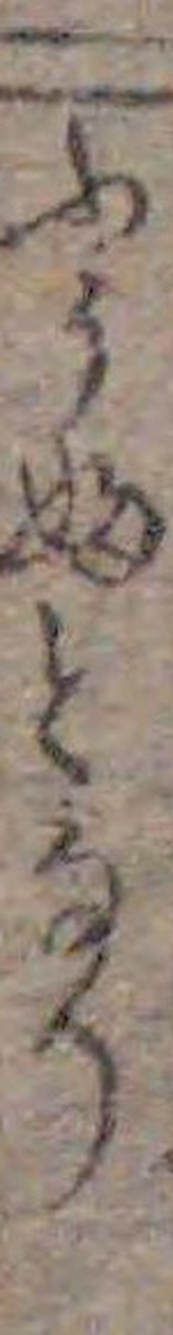ふうふとなり
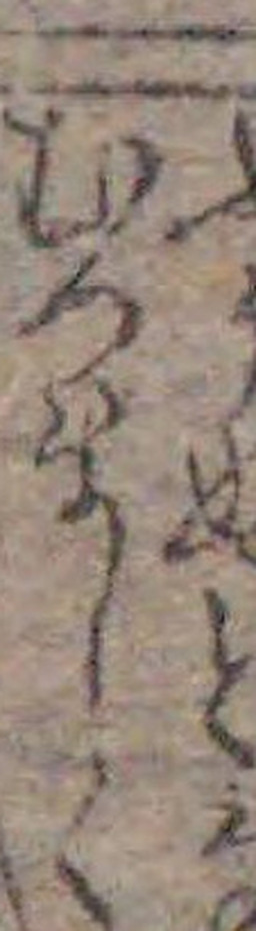むつましく
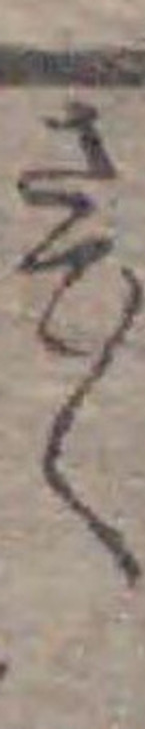さて〳〵
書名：神田与吉一代記 : 3巻
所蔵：国立国会図書館 National Diet Library, JAPAN
